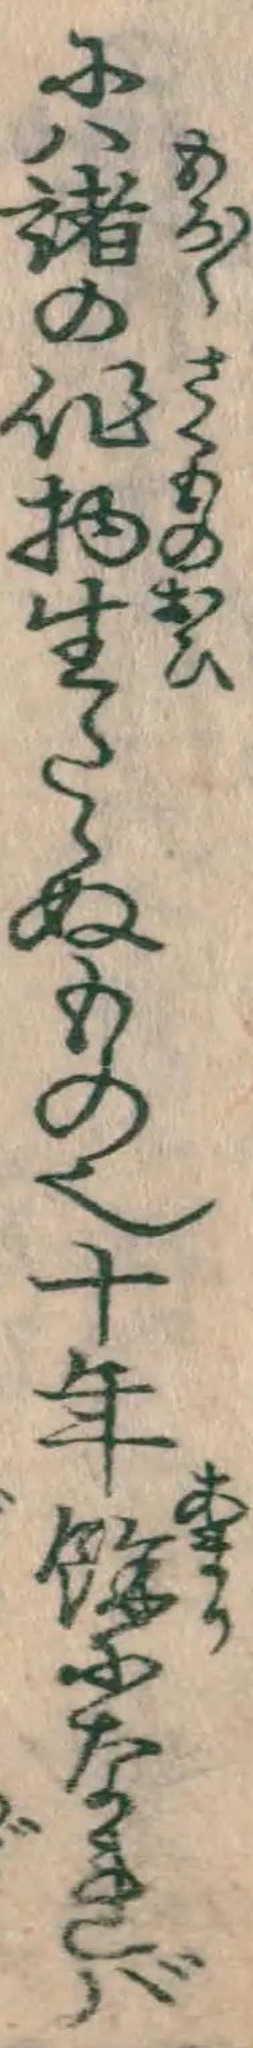には諸の作物生たらぬもの也十年余になれば
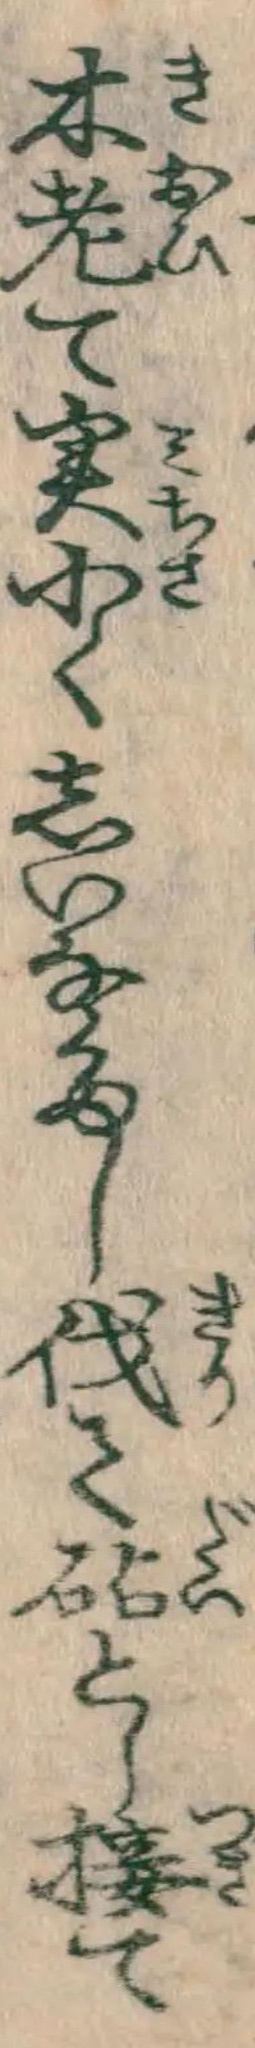木老て実小くしいな多し伐て砧とし接て
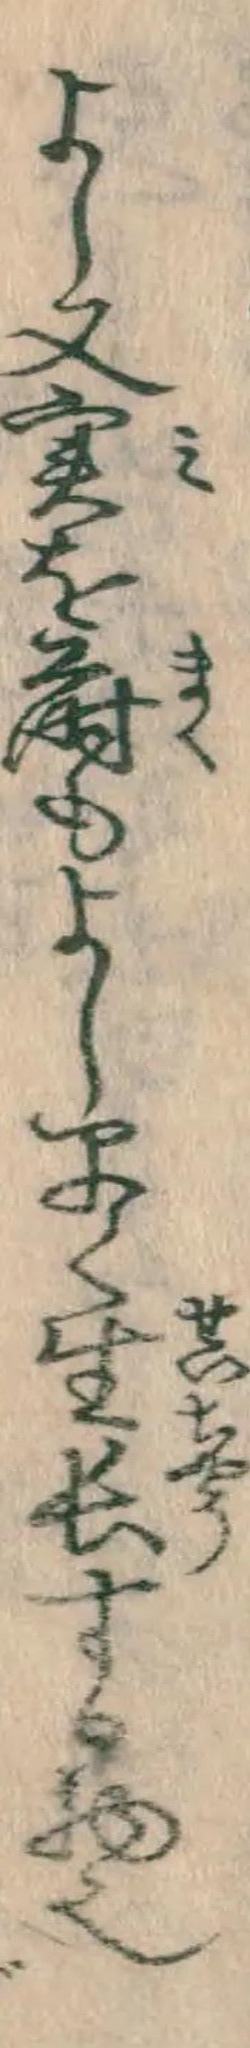よし又実を蒔もよし早く生長する物也
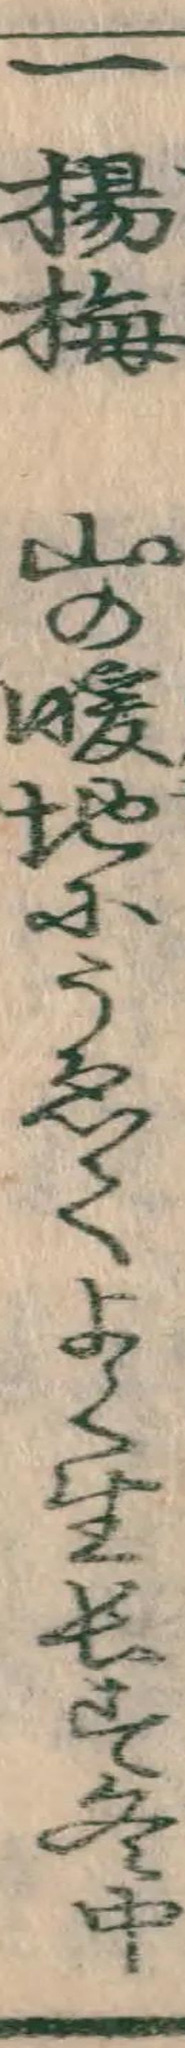一楊梅山の暖地にうゑてよく生長す冬中
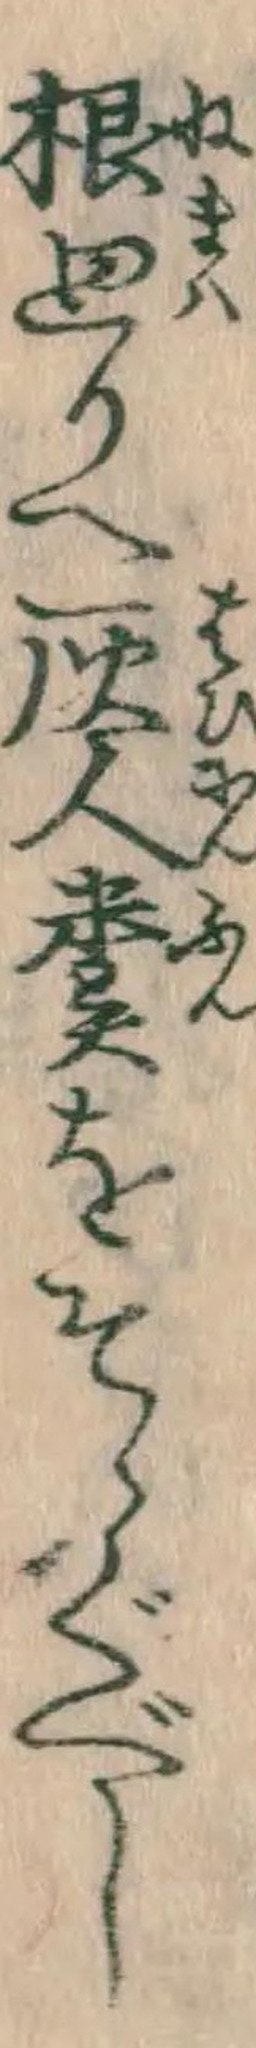根廻りへ灰人糞をそゝぐべし
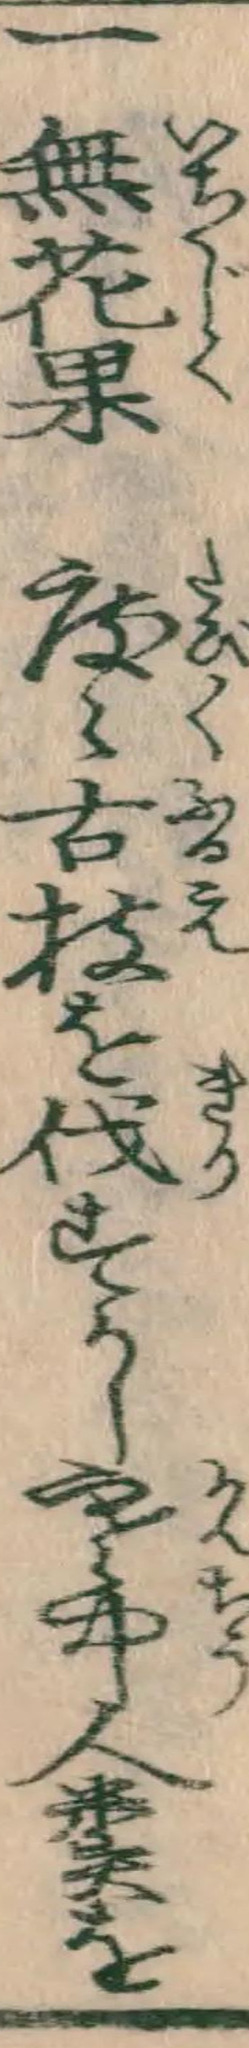一無花果度々古枝を伐すかし寒中人糞を
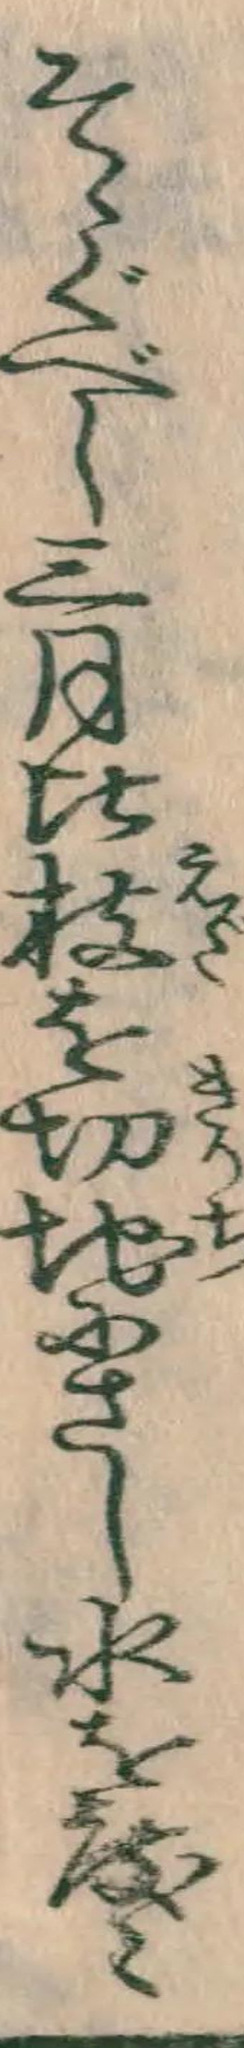そゝぐべし三月比枝を切地にさし水を度々
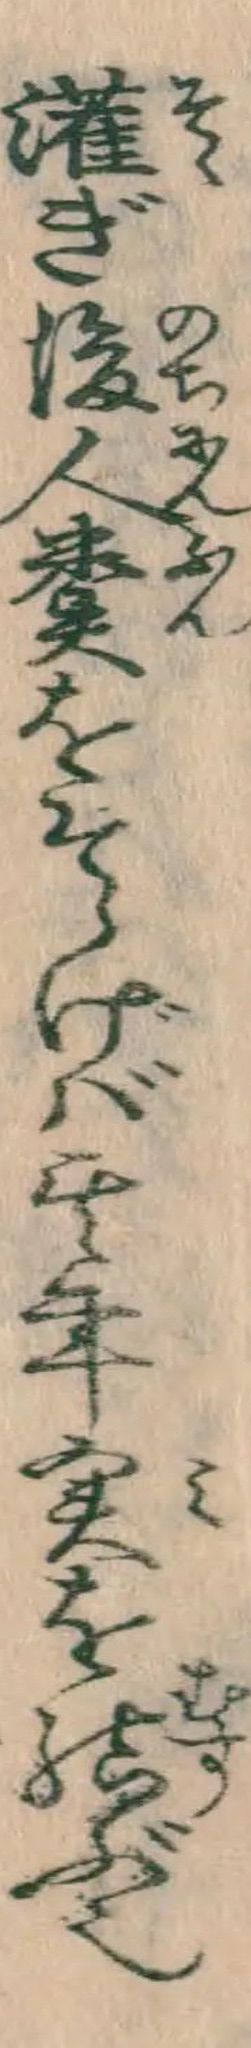灌ぎ後人糞をそゝげば其年実を結ぶ也
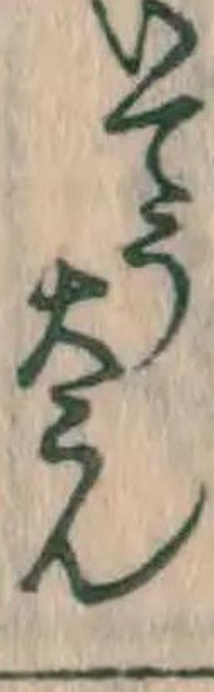大こん
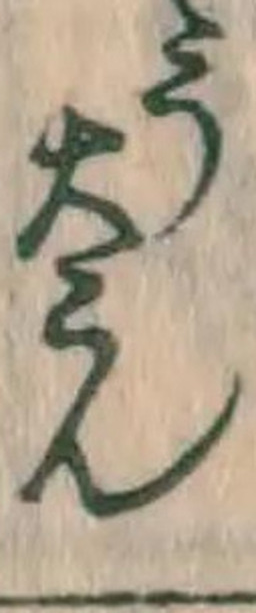大こん
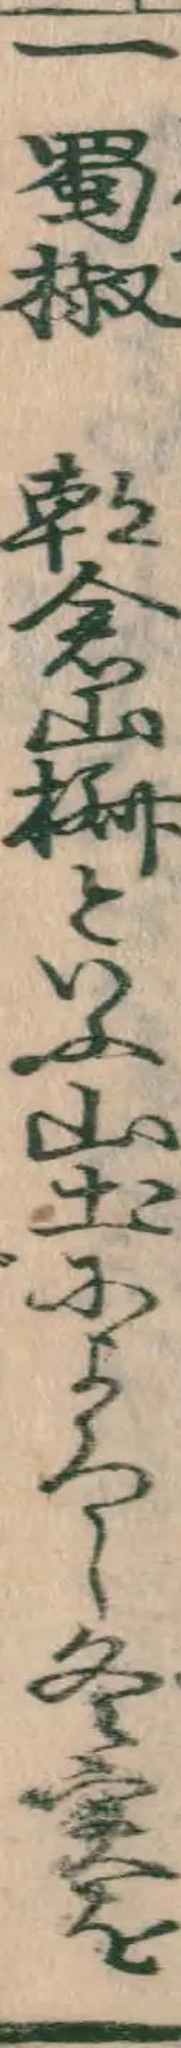一蜀椒朝倉山桝といふ山土によろし冬実を
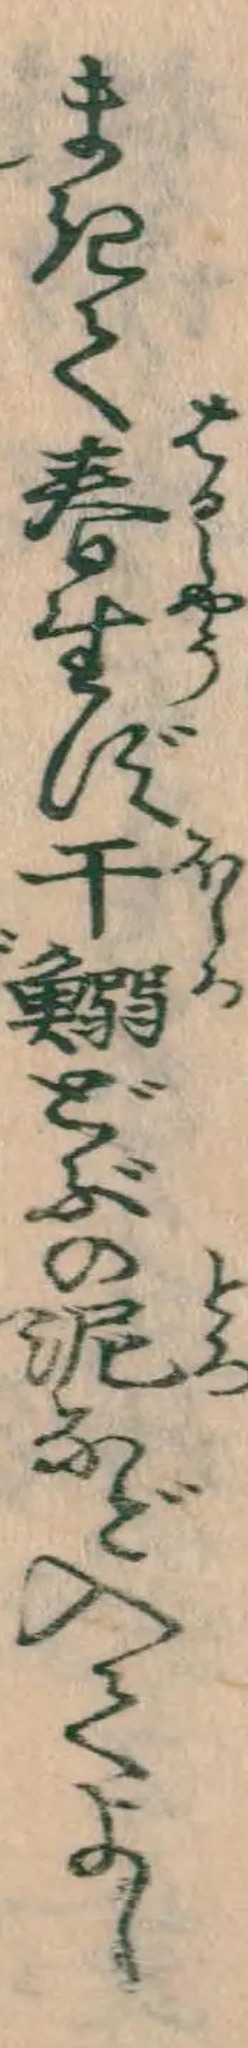まきて春生ず干鰯どぶの泥など入てよし
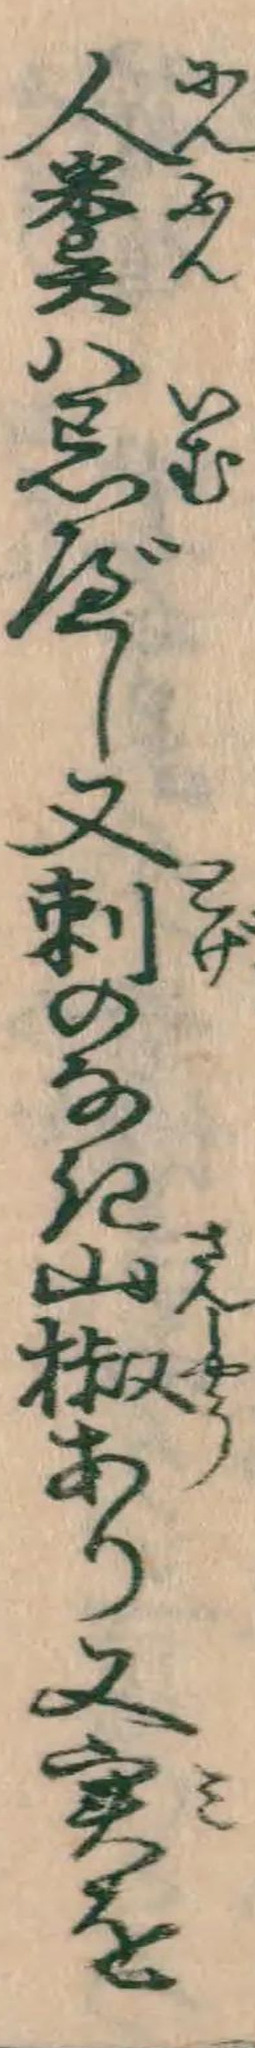人糞は忌べし又刺のなき山椒あり又実を
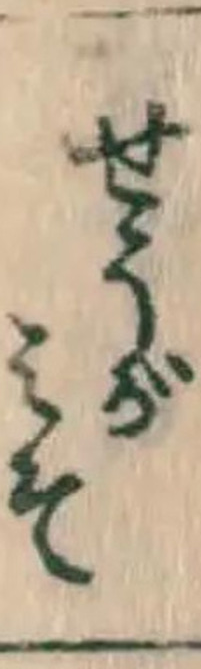せうがはえ
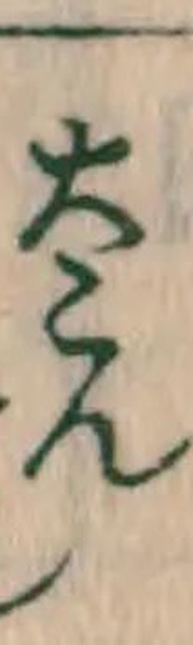大こん
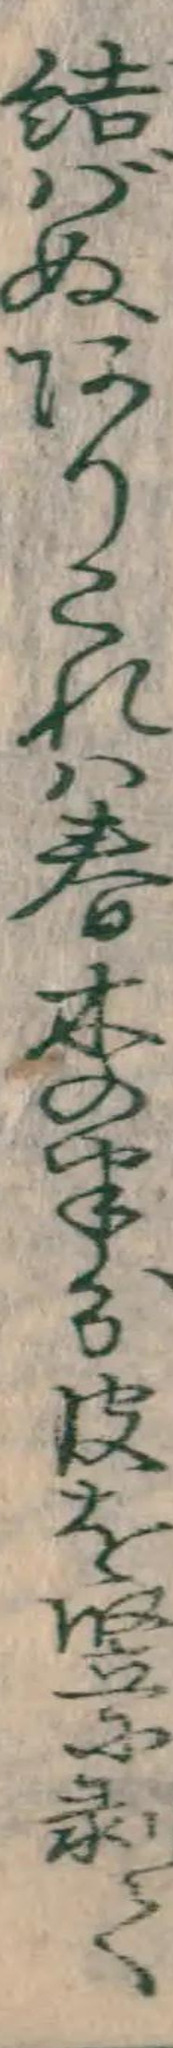結ばぬありこれは春木の半分皮を竪に剥て
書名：広益秘事大全 3巻. [5]
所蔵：国立国会図書館 National Diet Library, JAPAN
